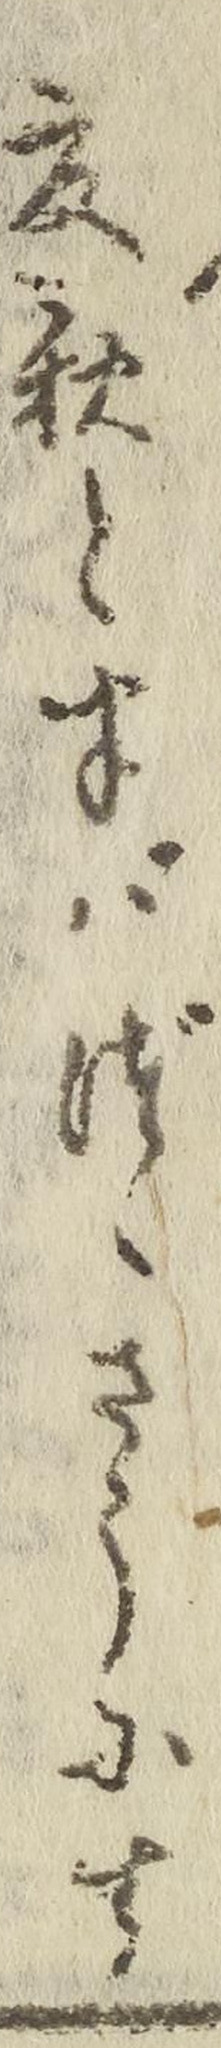夏秋と半ばづゝさうにす
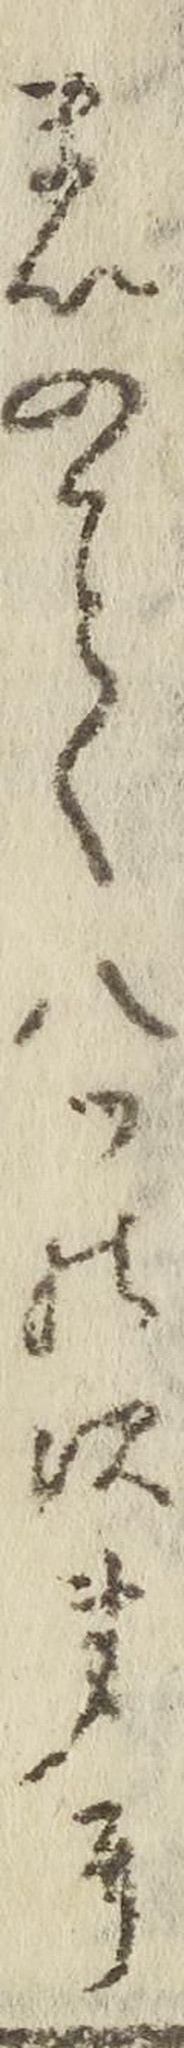まいのことく八つの次第に
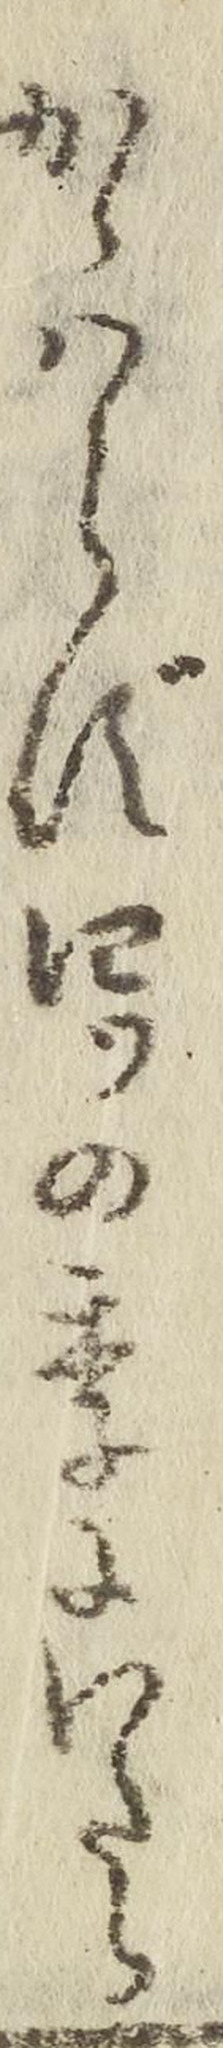かゝはらず四つの季にわたら
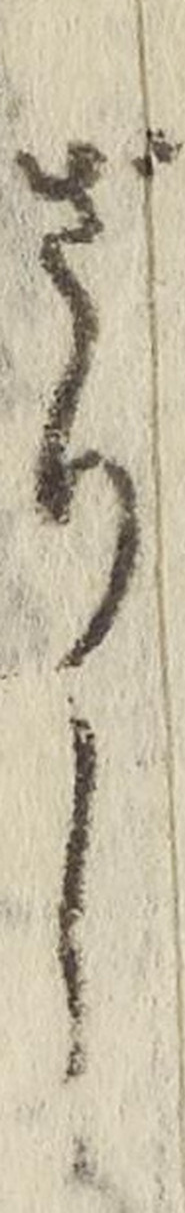ざりし
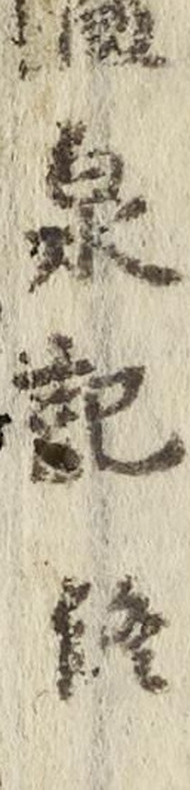温泉記終
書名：日光山中禅寺　温泉記　全
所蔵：東京大学地震研究所図書室 Earthquake Research Institute Library, The University of Tokyo, JAPAN
